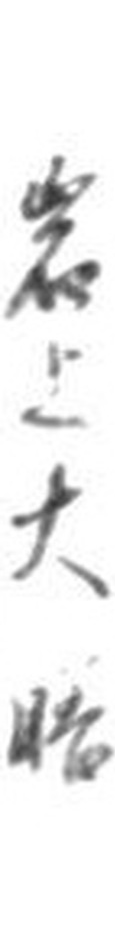岩上大膳
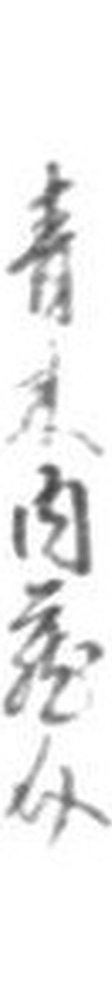青木内蔵介
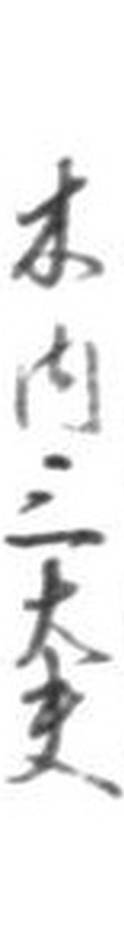木内三大夫
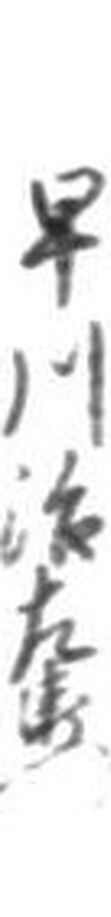早川治左衛門
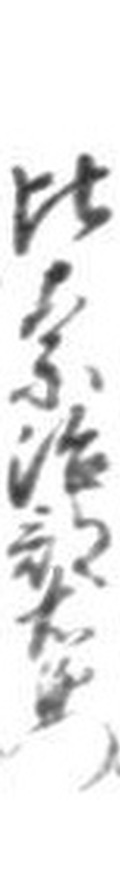比奈治部右衛門
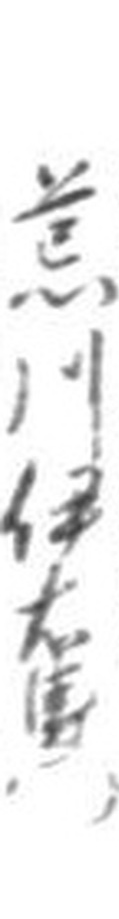荒川伊右衛門
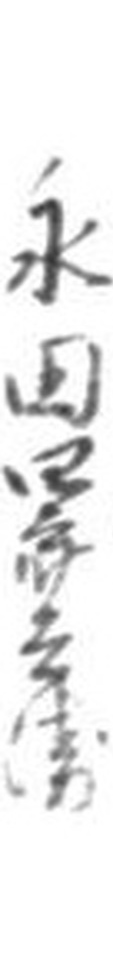永田四郎兵衛
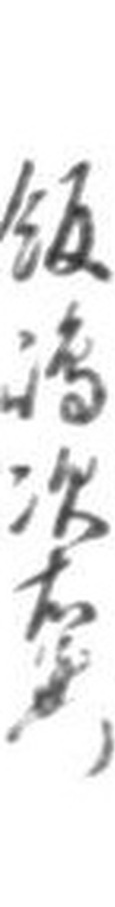飯嶋次右衛門
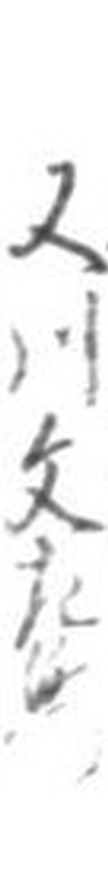又川文左衛門
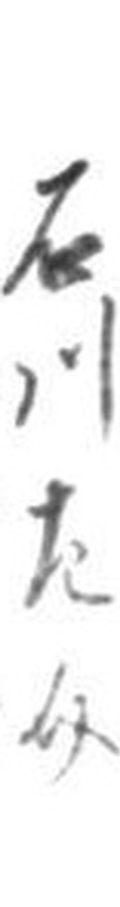石川左介
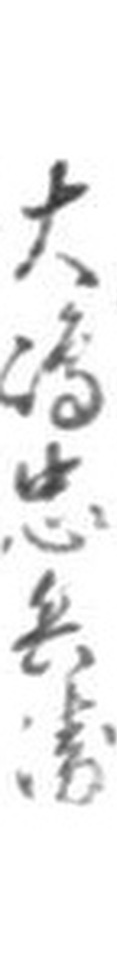大嶋忠兵衛
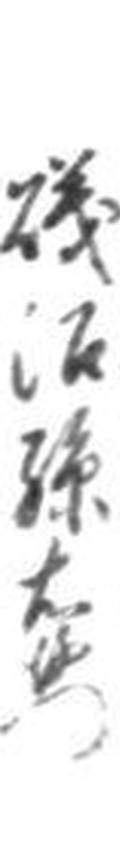磯沼孫右衛門
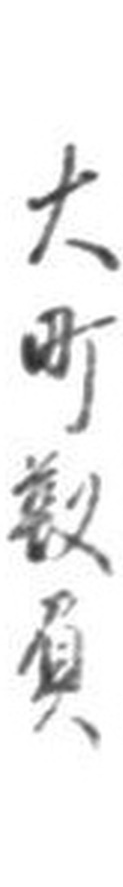大町靱負

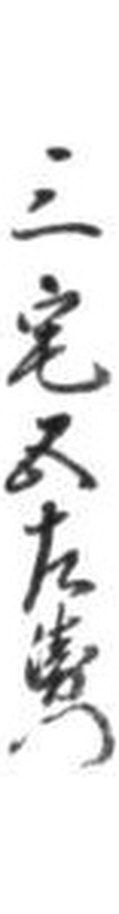三宅五左衛門
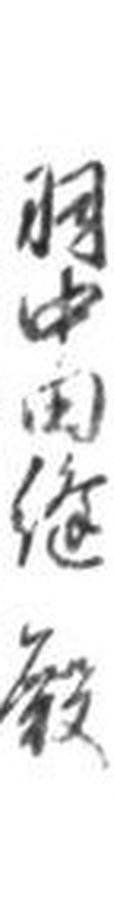羽中田縫殿
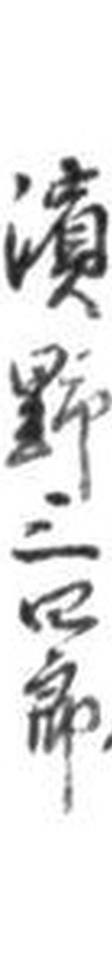浜野三四郎
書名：家譜 二 忠直公 従文禄四年到慶安四年
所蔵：福井県文書館 Fukui Prefectural Archives
